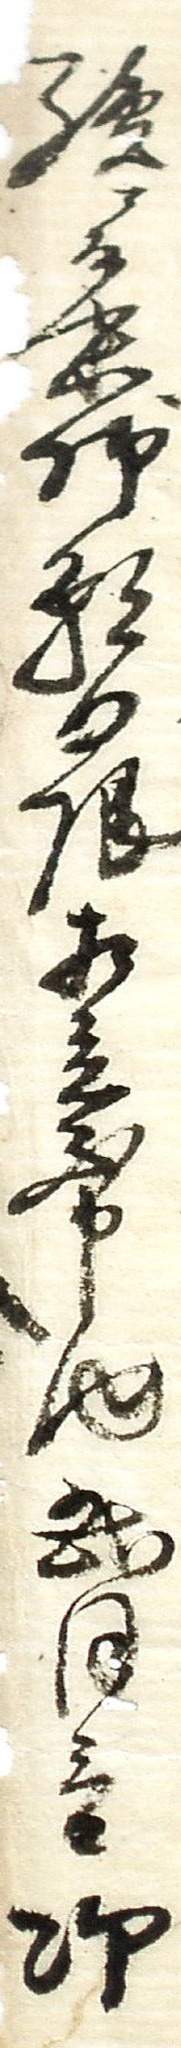續ニ而未御願日限相立不申内此月三日御
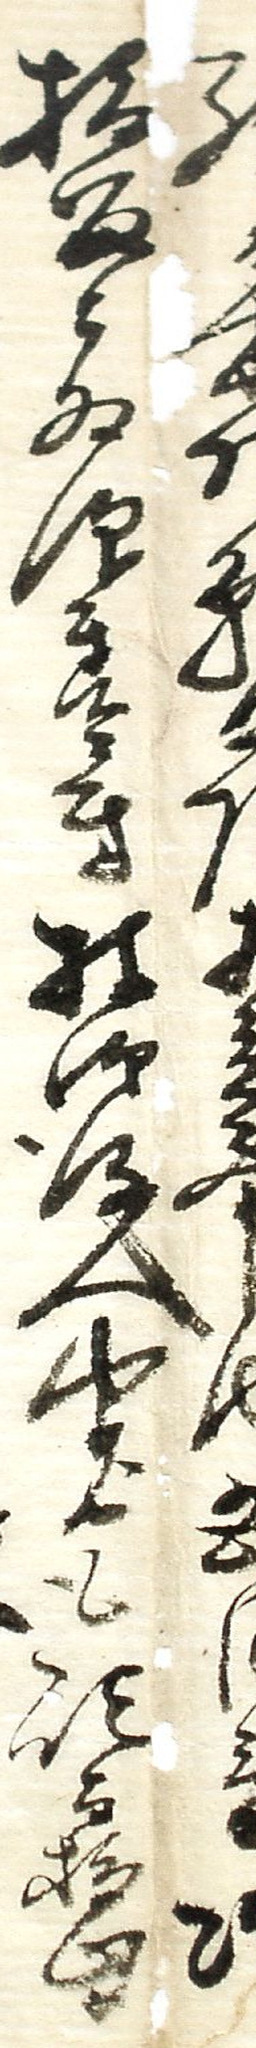指留被為仰付候ニ付村御役人中ゟも屹与指止メ
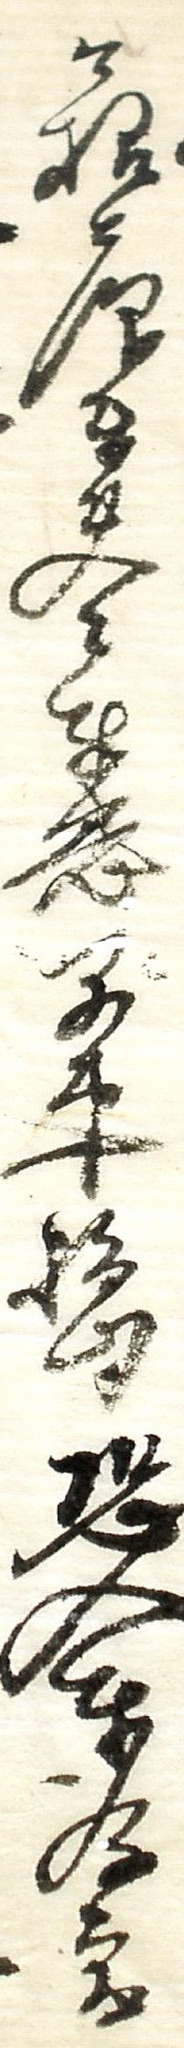候様被仰付夫々奉畏早束指止メ恐入奉存候処
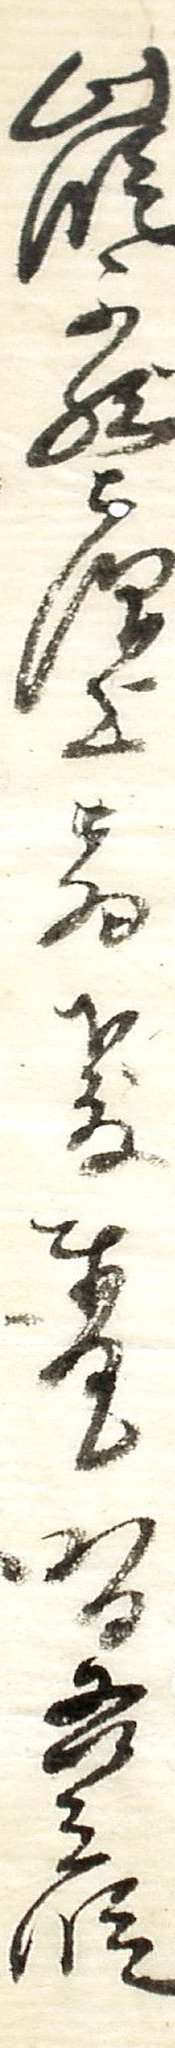此段可然被仰上被為下度奉存候仍而右之段
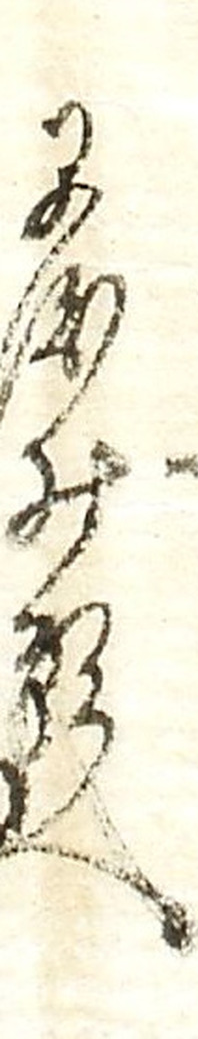早渕村願人
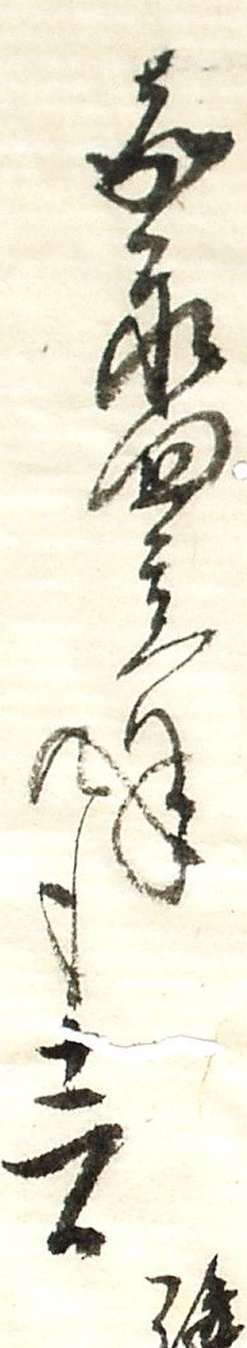嘉永四亥年安太郎
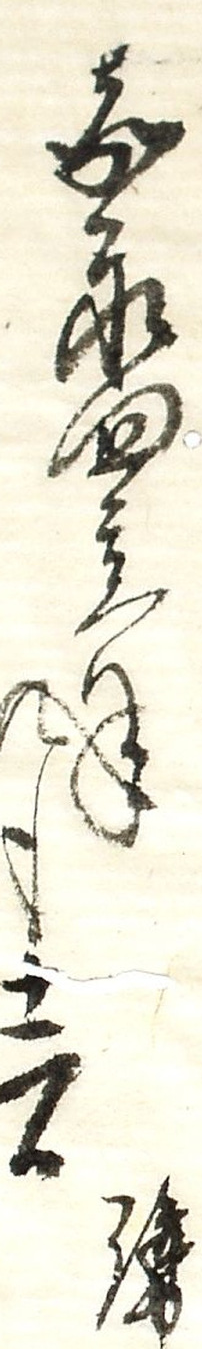嘉永四亥年安太郎
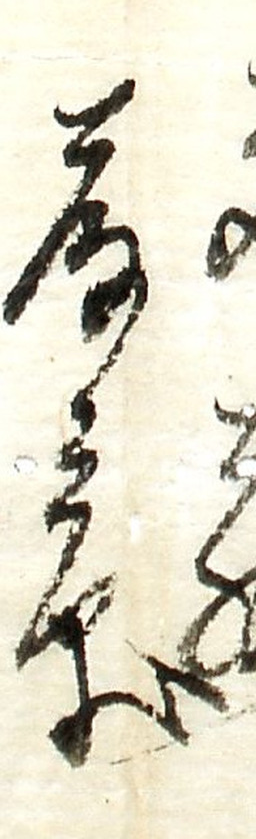藤兵衛
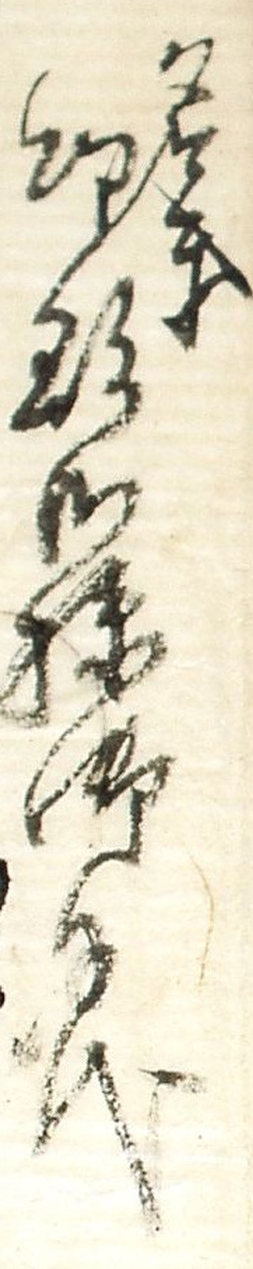御郡代様御手代
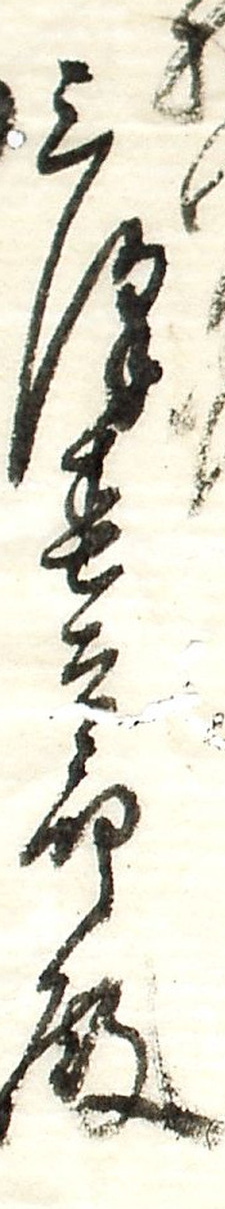三澤春太郎殿
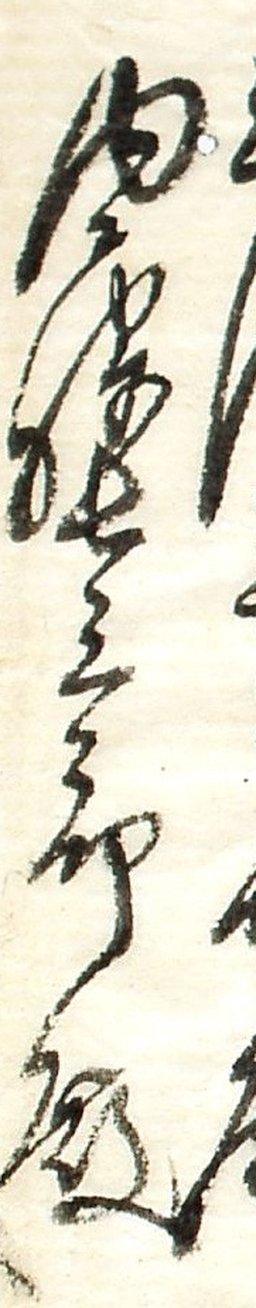内藤長三郎殿
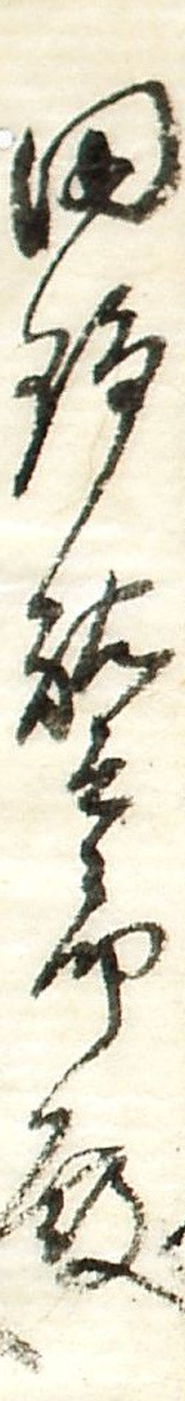田野祐太郎殿
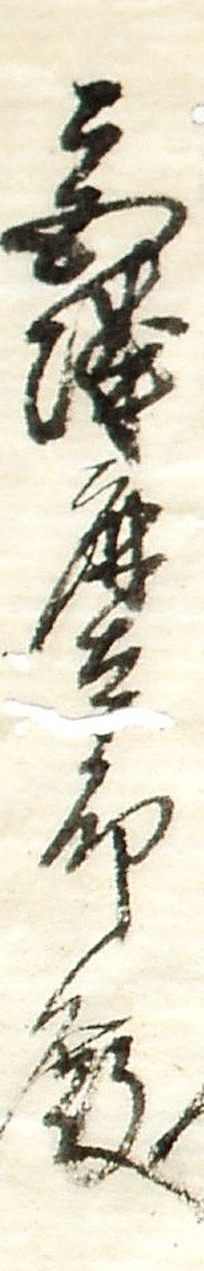宮城麻太郎殿
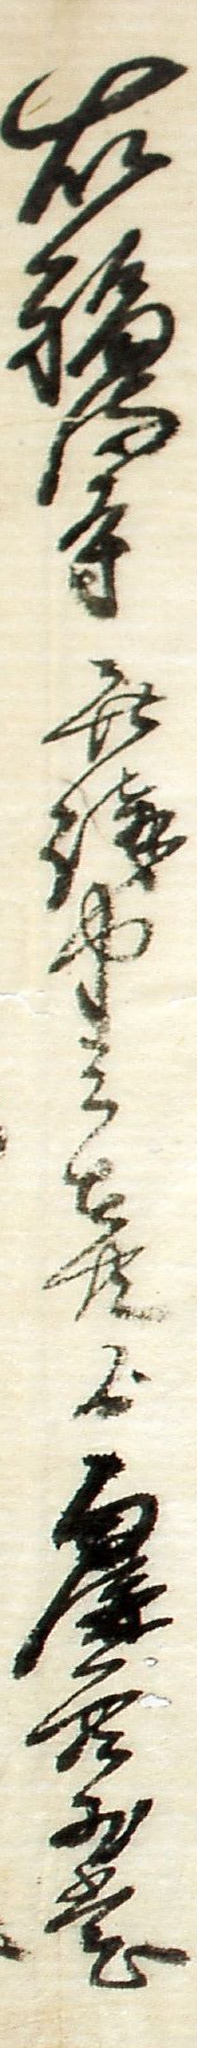右福満寺幷講中之者共ゟ虚空蔵堂
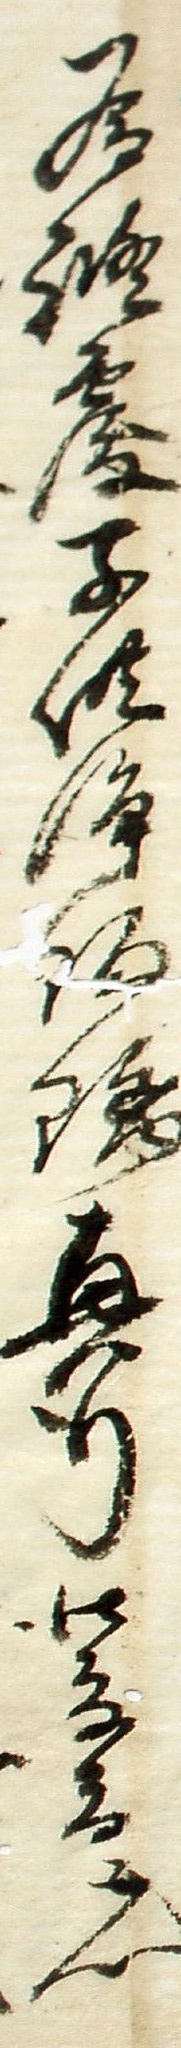為修覆子供浄瑠璃興行仕度旨を以
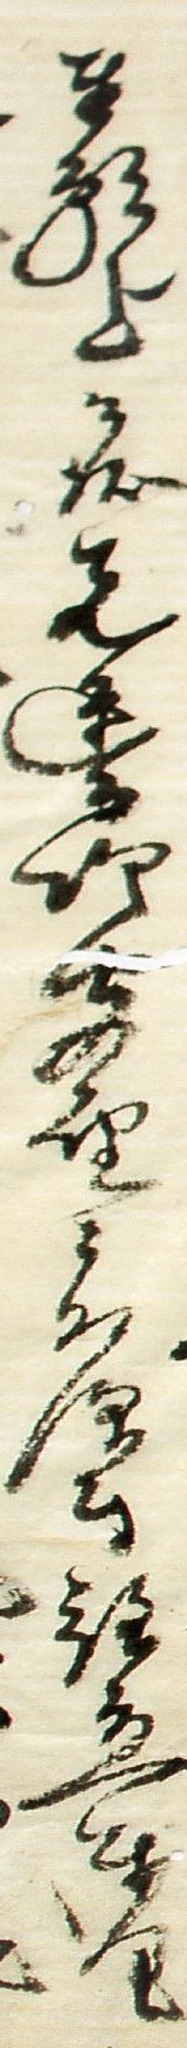奉願上候所先達而御聞届被為仰付難有奉存候
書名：(早渕村福満寺子供浄瑠璃願書）他
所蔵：鳴門教育大学 Naruto University of Education
